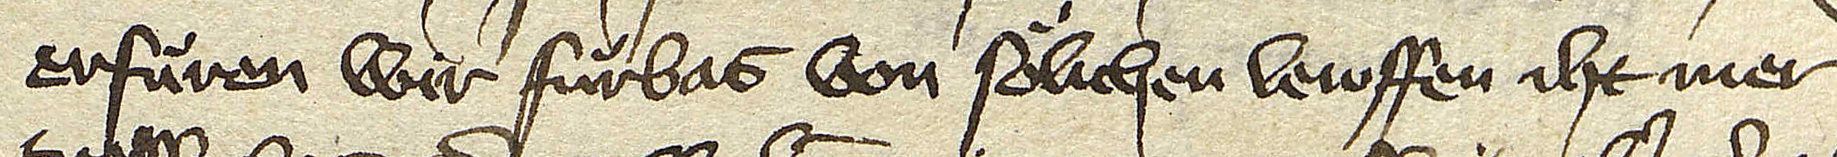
erfüren wir fürbas von ſölichen lewffen iht mer
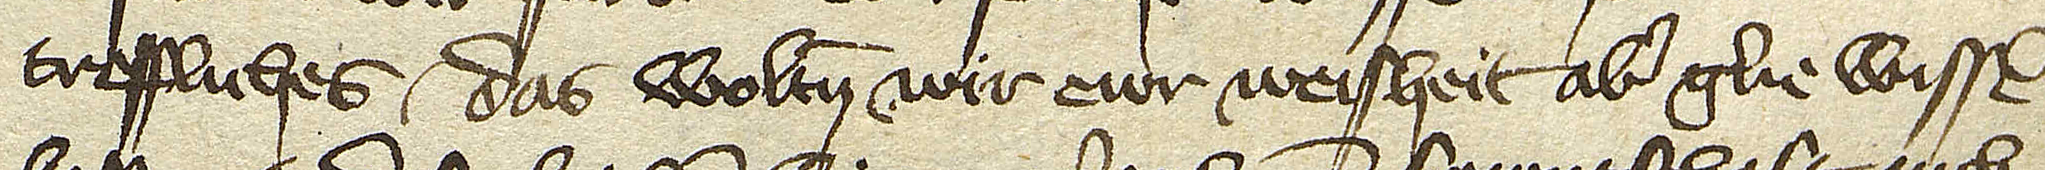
treffliches / Das woltn* wir ewr weiſheit ab* g*ne wiſſe*
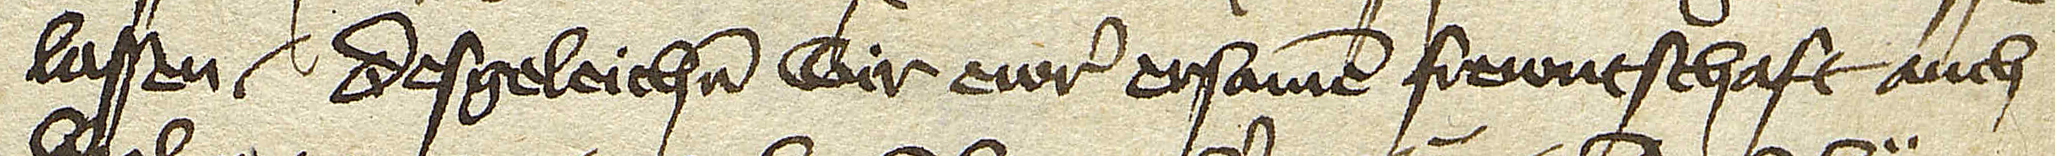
laſſen / Desgeleichn* wir ewr* erſame* frewntſchaft auch
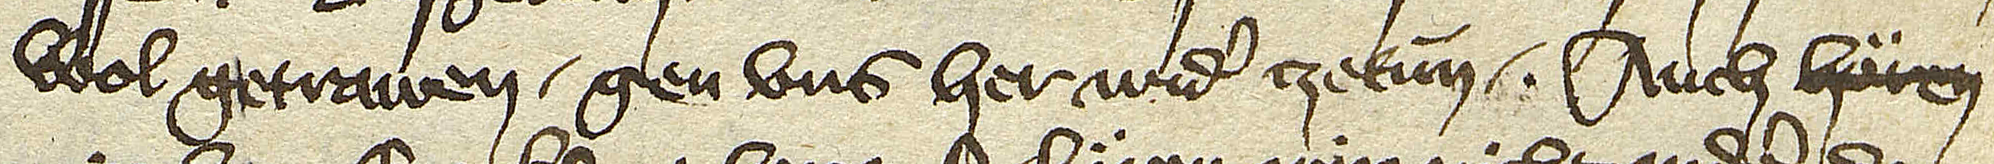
wol getrawen / gen vns her wid* cʒetün / . Auch hören
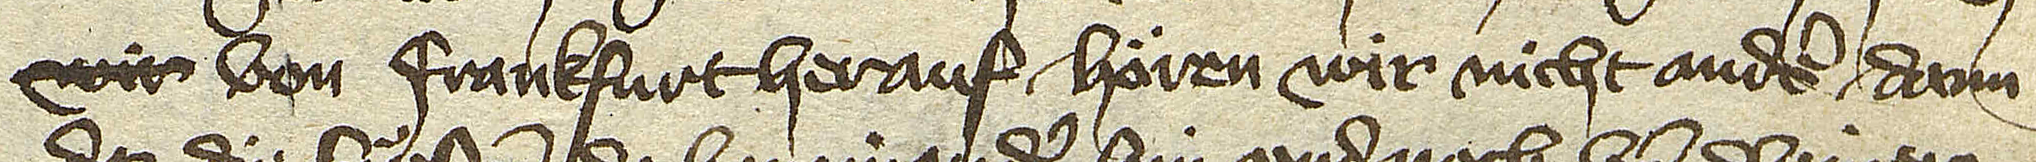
wir von Frankfurt herauf / hören wir nicht ands* / dann
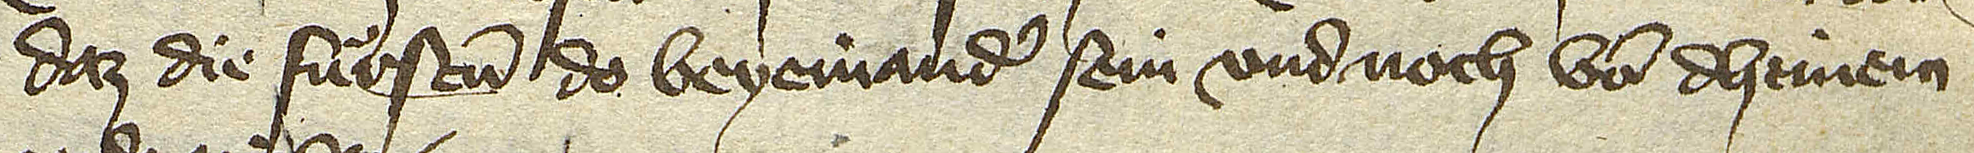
daʒ die fürſtn* do beyeinand* ſein vnd noch vo* dheinen
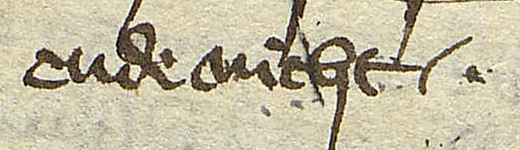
ende nicht / .
